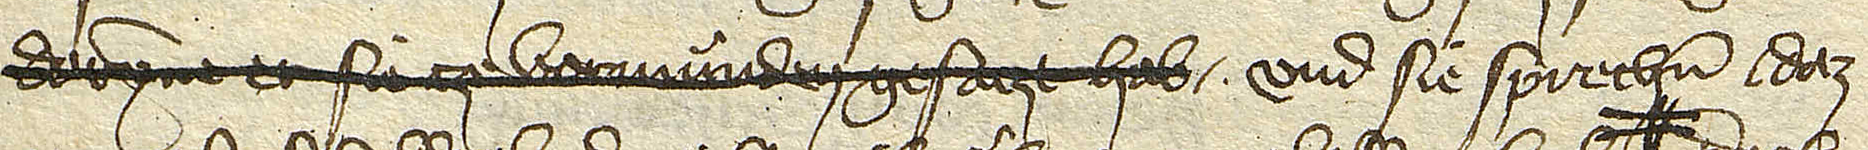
daryne* er ſie cʒe vormünden geſacʒt hab / . vnd ſie ſprechn* / daʒ
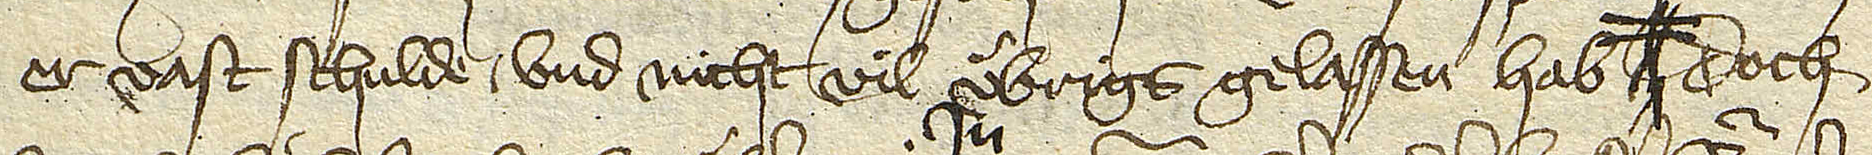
er vaſt ſchulde / vnd nicht vil v̈brigs gelaſſen hab / Doch
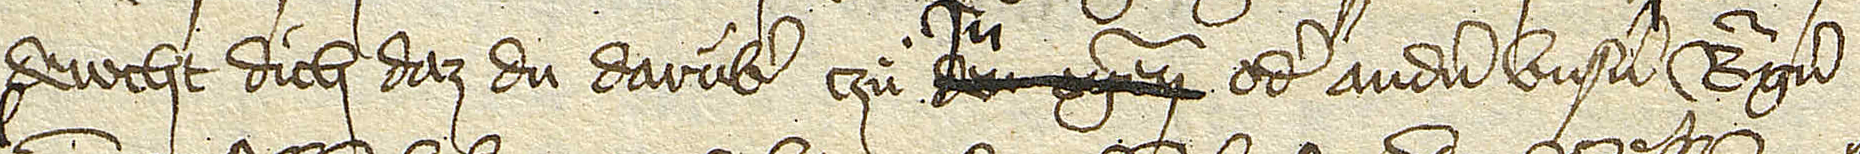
dewcht dich daʒ du darüb* cʒü den egen* od* andn* vnſn* B*gn*
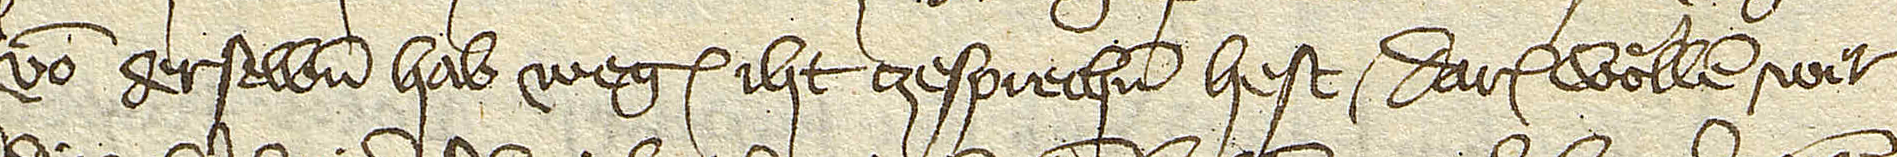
vo* derſelbn* hab weg* iht cʒeſprechn* heſt / Dar* wölle* wir
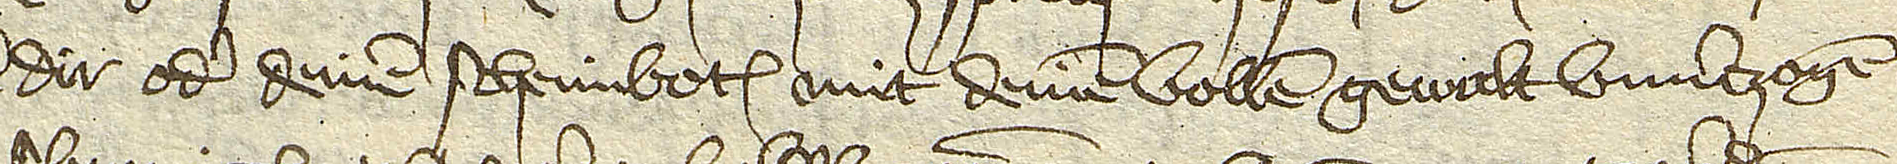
dir od* deine* ſcheimbot* mit deine* volle* gewalt vno*cʒoge*
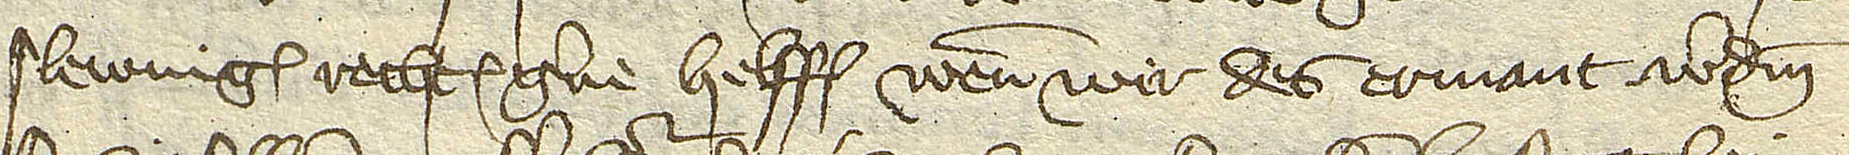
ſlewnig* recht g*ne helff* wen* wir des ermant w*dn*
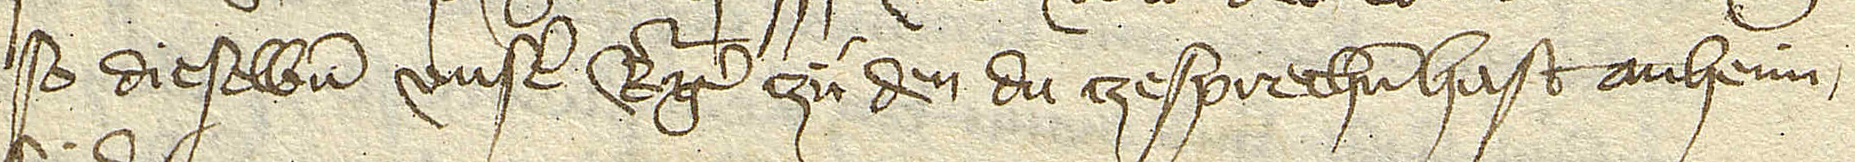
ſo dieſelbn* vnſe* B*g* cʒü den du cʒeſprechn* haſt anheim
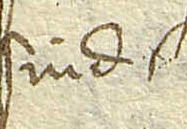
ſind /
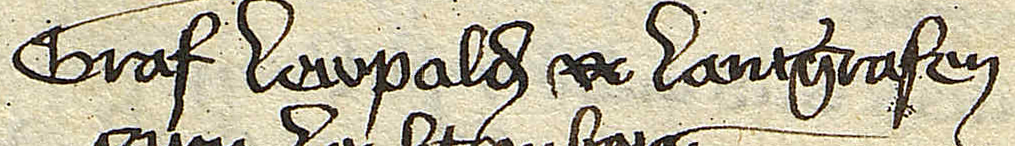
Graf Lewpold* v Lantgrafen
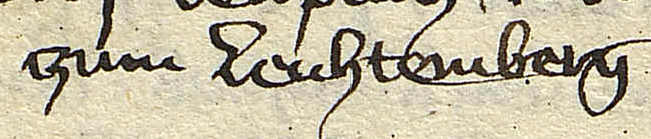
cʒum Leuhtemberg
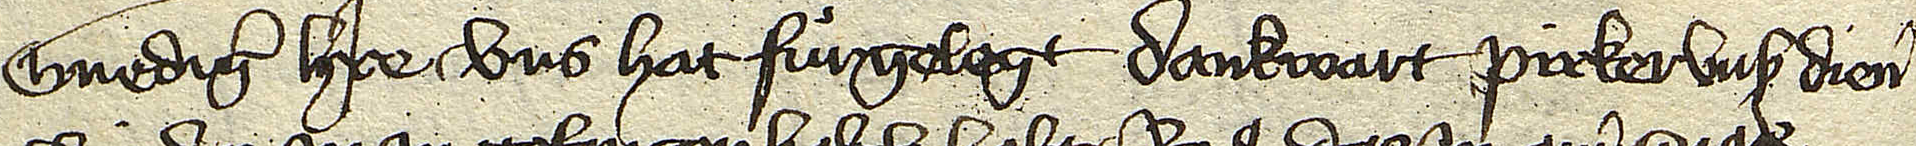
Gnedig* h*re / vns hat fürgelegt dankwart Pirker vnſ* dien*
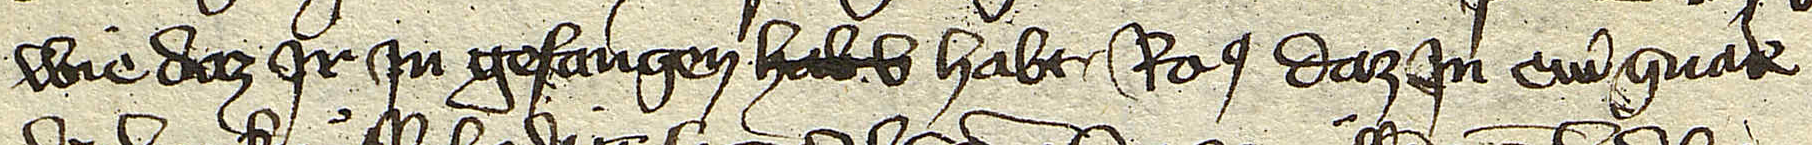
wie daʒ Ir In gefangen hab v habt / Ro* daʒ In ew* gnade
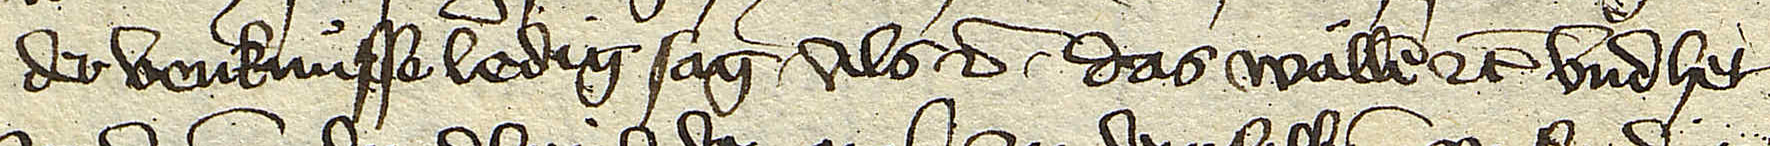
der venknüſſe ledig ſag / Als ec* / das wölle* ec* vnd het
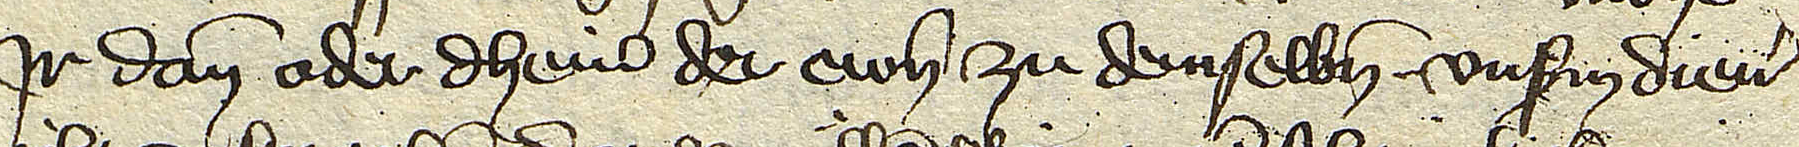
Ir dan* oder dhein* der ewn* cʒu demſelbn* ~ vnſ*m dien*
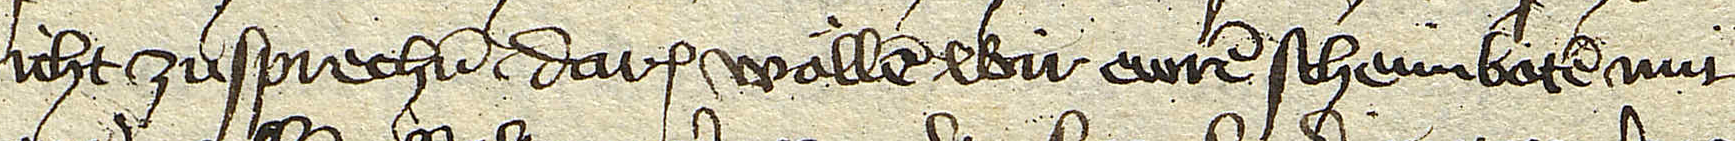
icht cʒuſprechn* / dar* wölle* wir ewre* ſcheimbote* mit
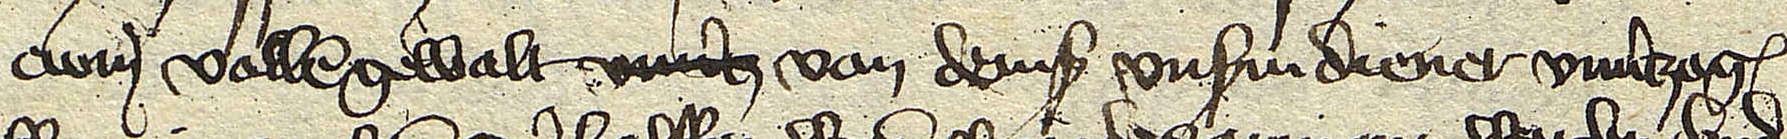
ewm* volle* gewalt vnu*cʒ von demſ* vnſ*m diener vnu*cʒog*
